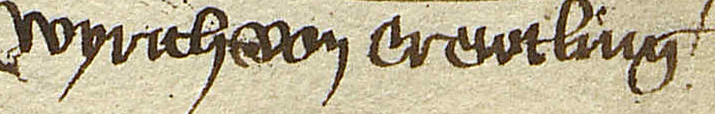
wyrich von Trewtling*
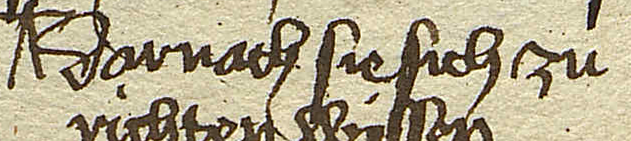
darnach ſie ſich cʒu
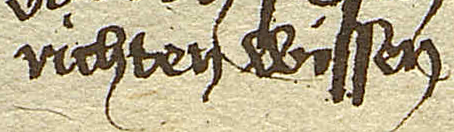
richten wiſſen
